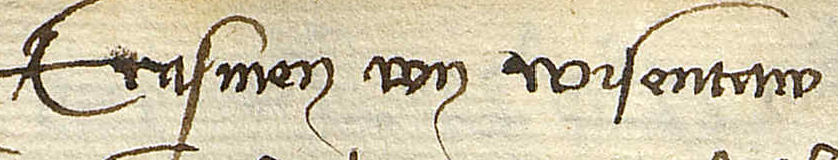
Eraſmen von wiſentaw
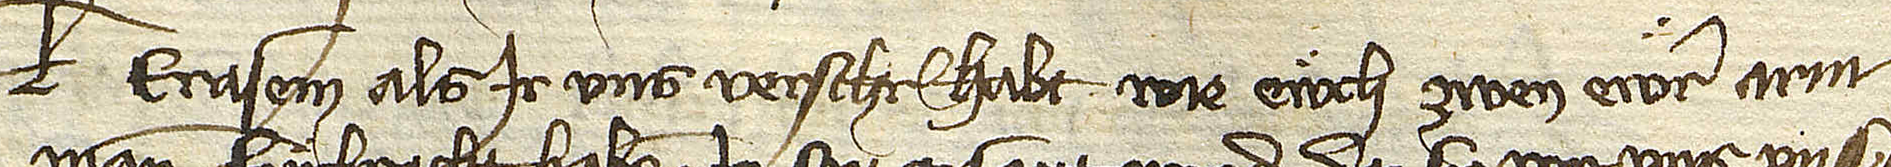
L* Eraſem als Ir vns verſchr* habt . wie ewch ʒwen ew*r arm -
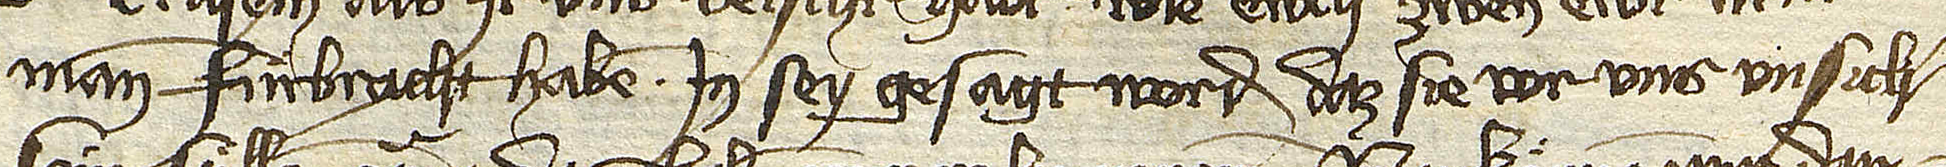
man* fürbracht habe* . In ſey geſagt word* daʒ ſie vor vns vnſich*
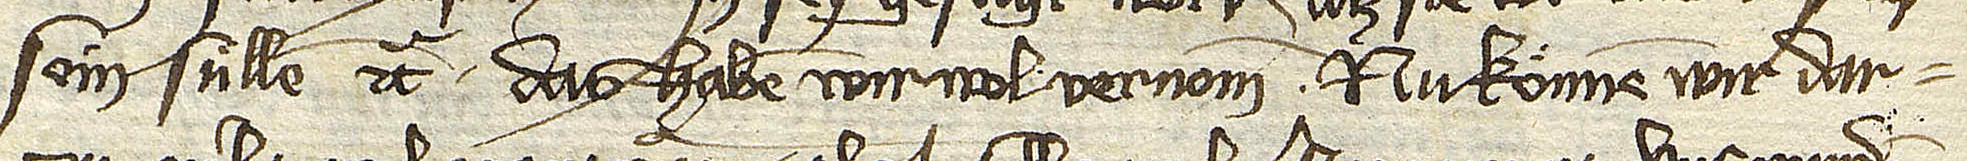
ſein ſülle* ec* / das habe* wir wol vernom* . Nu könne* wir dar =
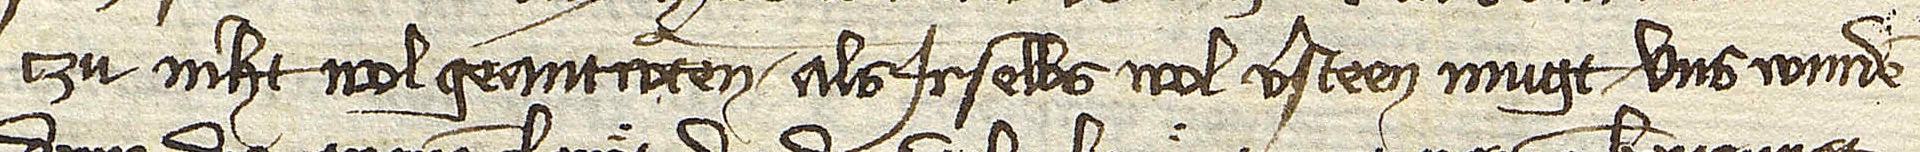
cʒu niht wol gewantw*ten / als Ir ſelbs wol v*ſteen mugt / Vns wurde*
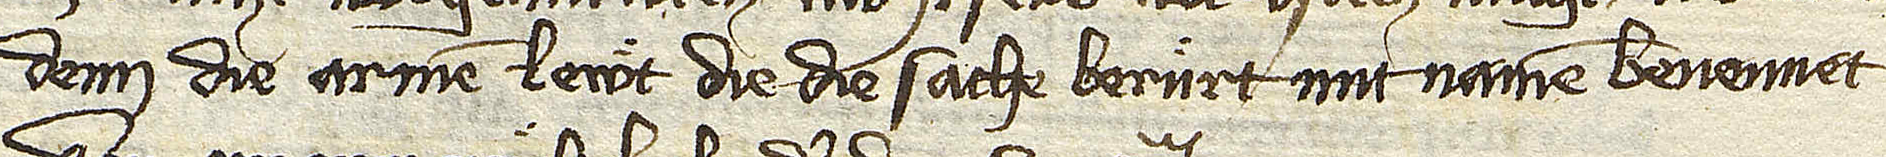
denn die arme* lewt die die ſache berürt mit name* benennet
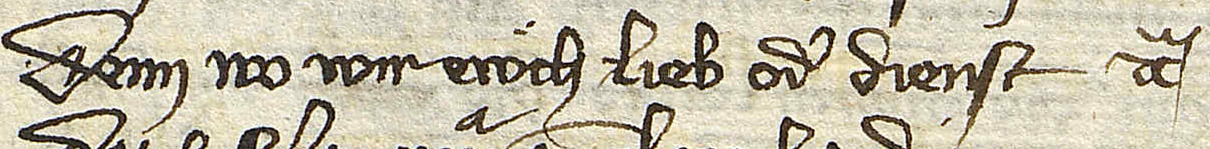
Denn wo wir ewch lieb od* dienſt ec*
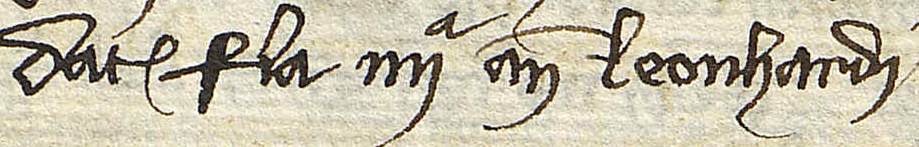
Dat* fia* iiii* an* Leonhardi
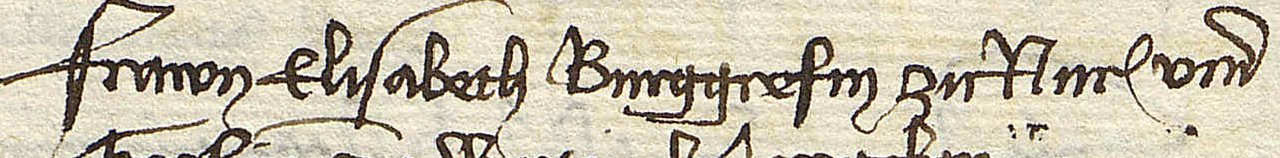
Frawn Eliſabeth Burggrefin ʒu Nur* vnd
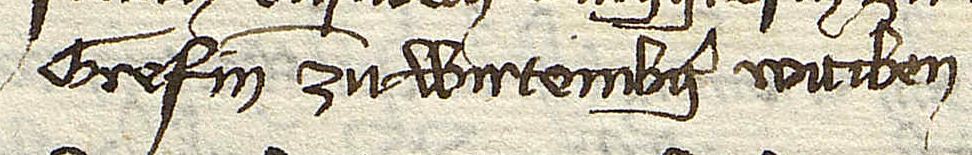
Grefin* ʒu Wirtemb*g witiben
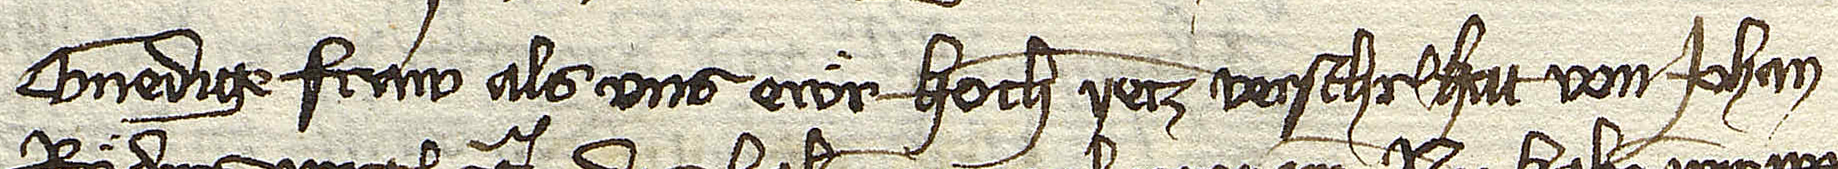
Gnedige fraw als vns ewr hoch* yecʒ verſchr* hat von Iohan
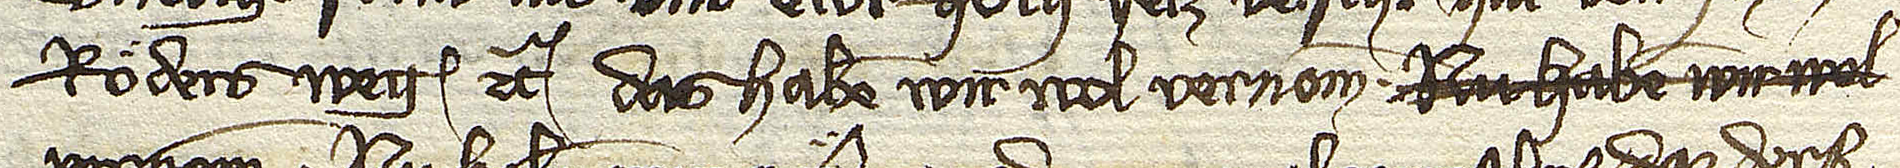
Röders weg* ec* das habe* wir wol vernom* . Nu habe* wir wol
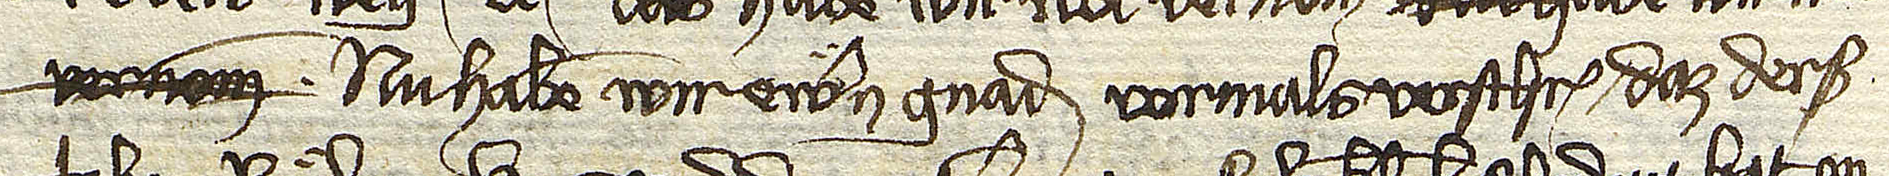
vernom* . Nu habe* wir ew*n gnad* vormals verſchr* / daʒ derſ*
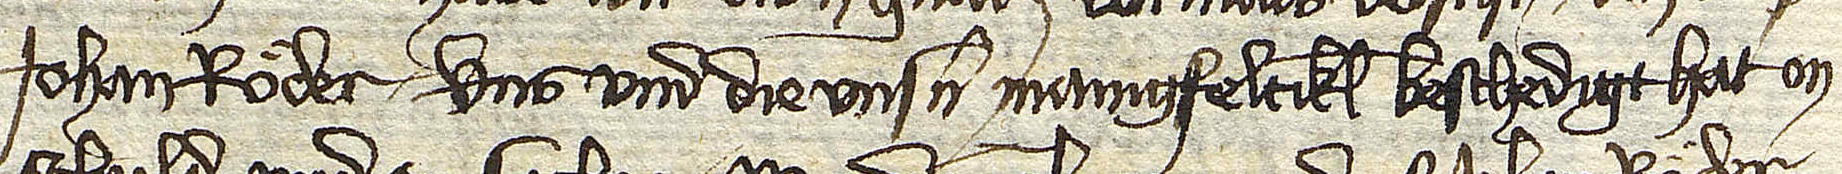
Iohan Röder / Vns vnd die vnſ*n manigfeltikl* beſchedigt hat on
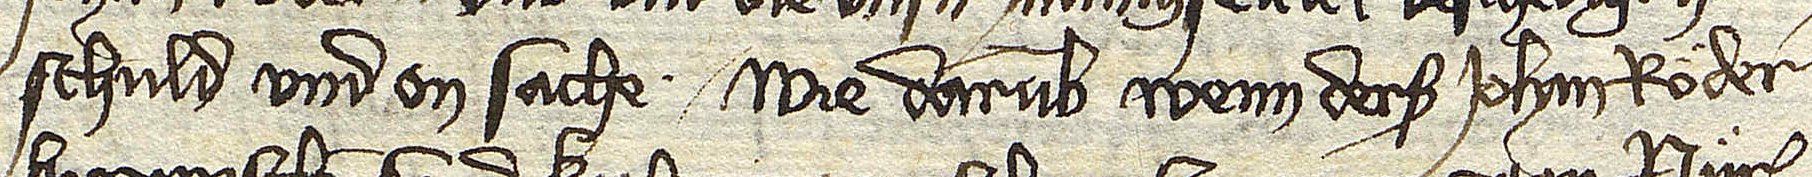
ſchuld vnd on ſache . / wie darub* wenn derſ* Iohan Röder
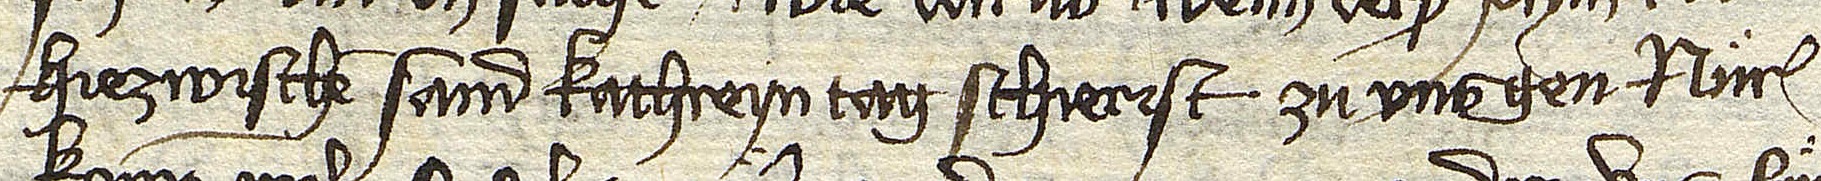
hieʒwiſche* ſand Kathreyn tag ſchieriſt . ʒu vns gen Nür*
